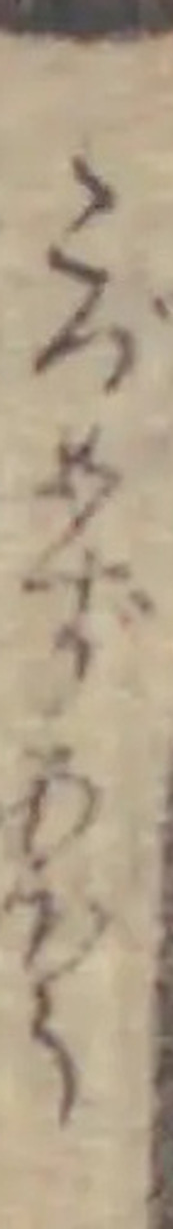こづめずあほう
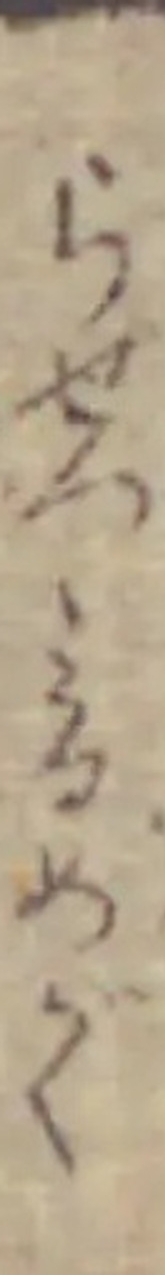らせつみるめかぐ
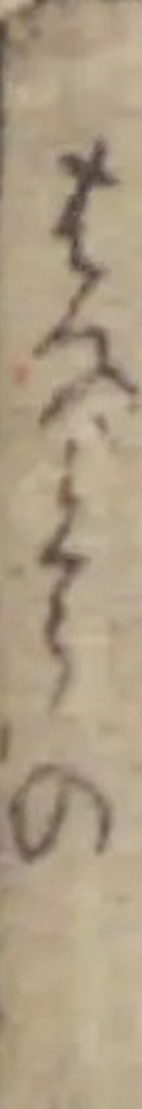はなとうの
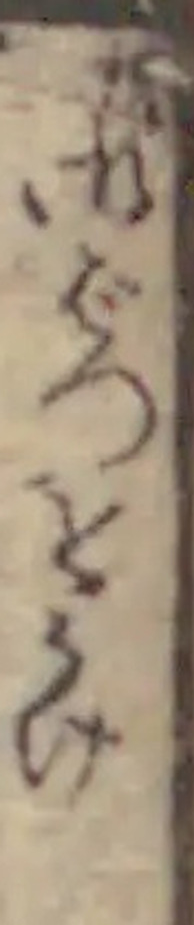御ばつをうけ
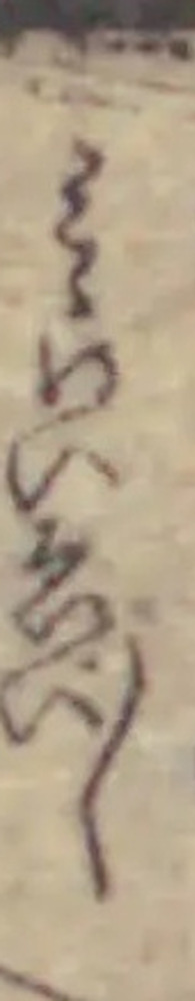みらいゑい〳〵
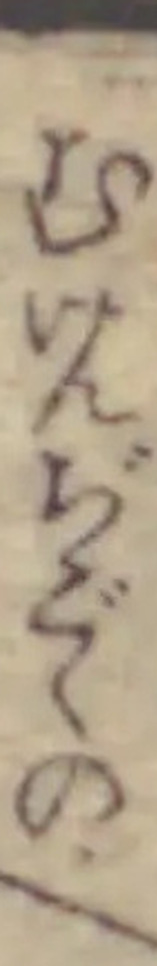むけんぢごくの
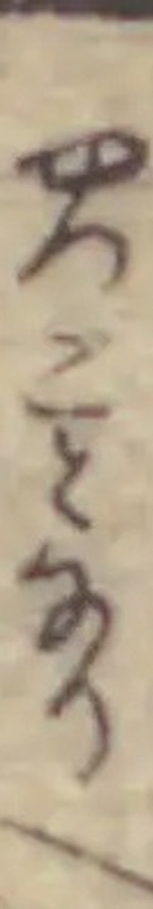やつことなり
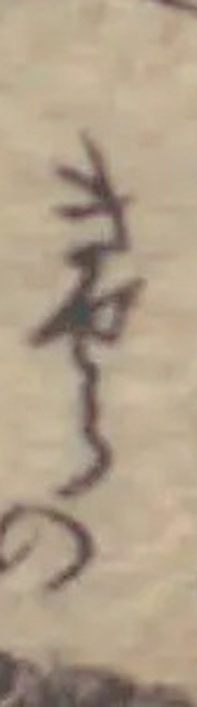きせうの
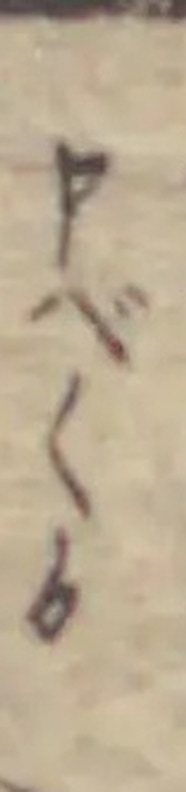申べく候
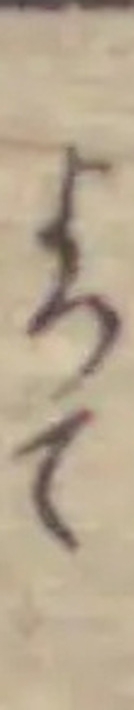よつて
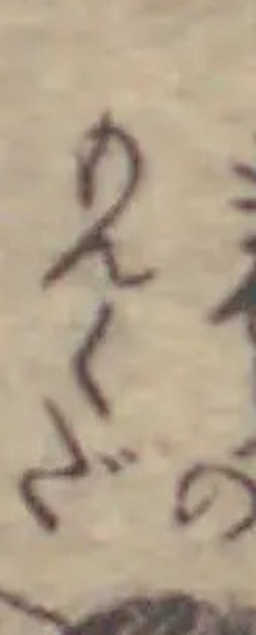もんくだ
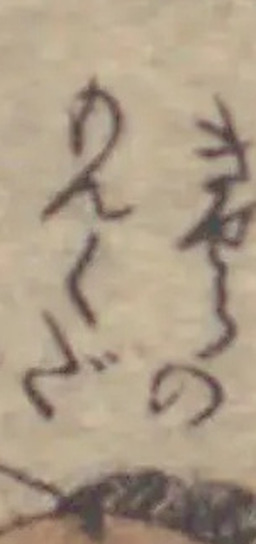もんくだ
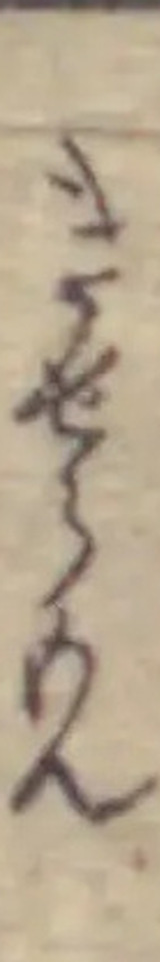きせうもん
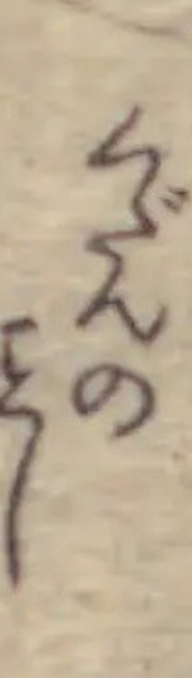くだんの
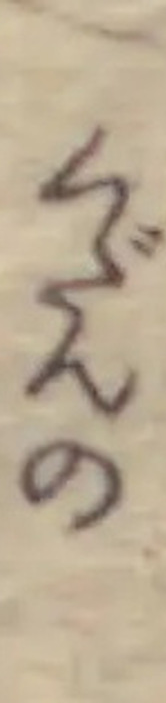くだんの
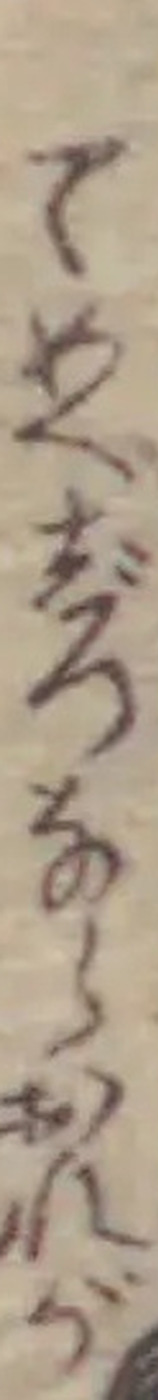てめへじつならおれが
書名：鬼子宝 3巻
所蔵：国立国会図書館 National Diet Library, JAPAN
